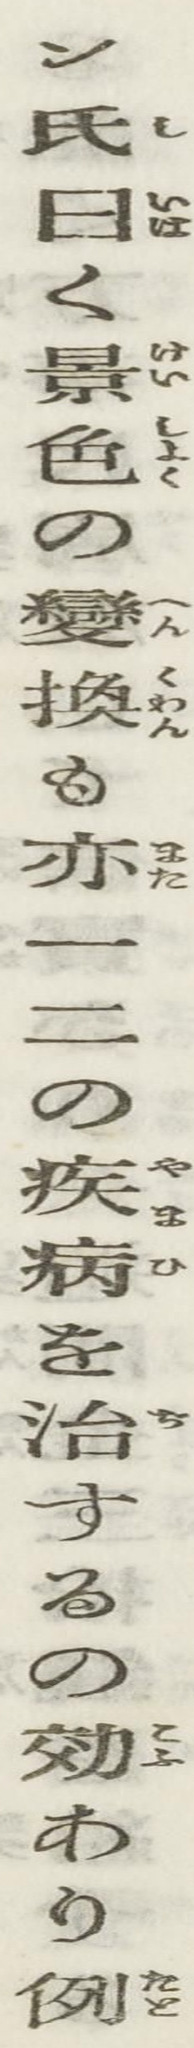ン氏曰く景色の変換も亦一二の疾病を治するの効あり例
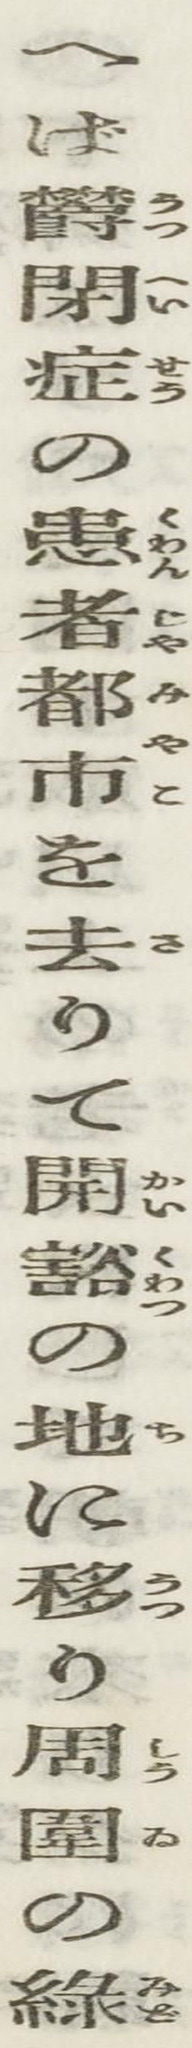へば鬱閉症の患者都市を去りて開豁の地に移り周囲の緑
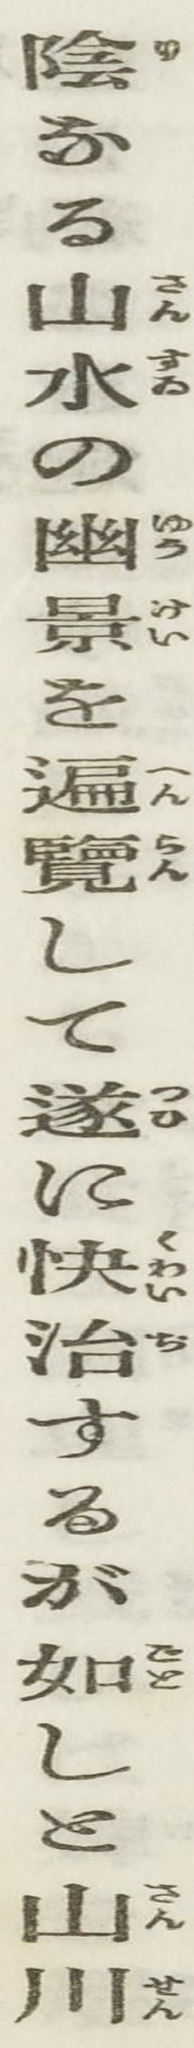陰なる山水の幽景を遍覧して遂に快治するが如しと山川
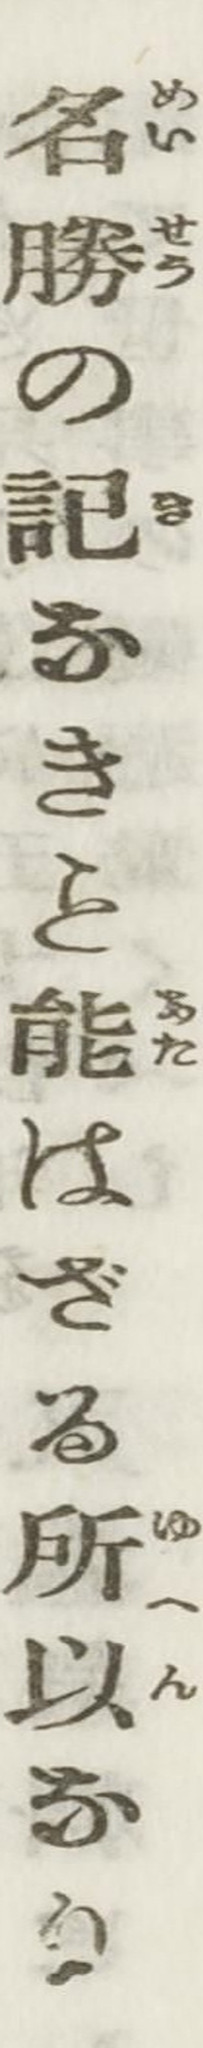名勝の記なきこと能はざる所以なり
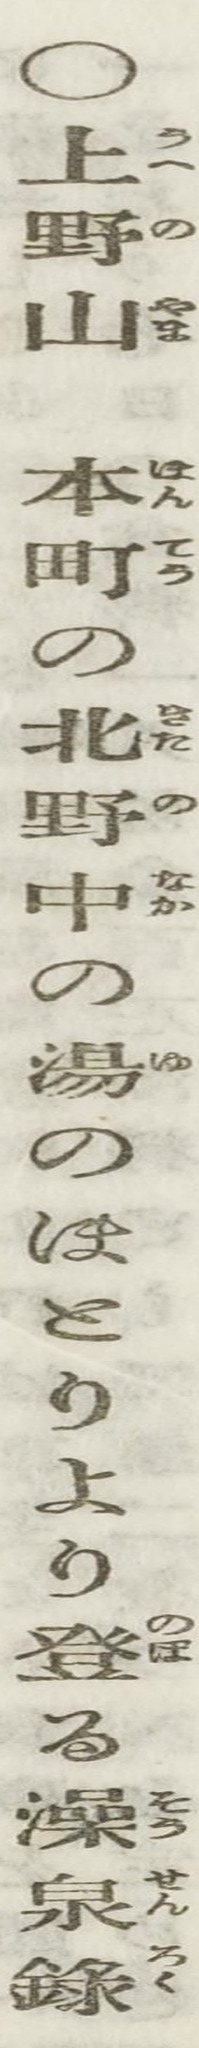○上野山本町の北野中の湯のほとりより登る澡泉録林祭
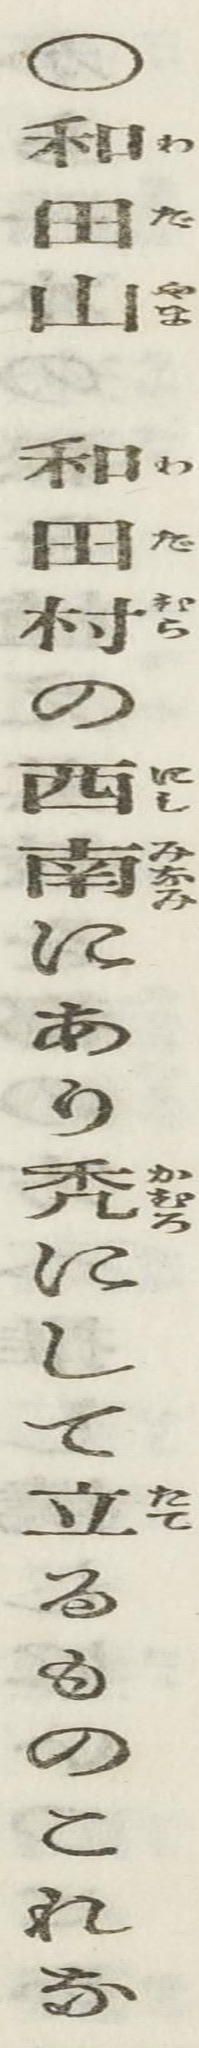○和田山和田村の西南にあり禿にして立るものこれな
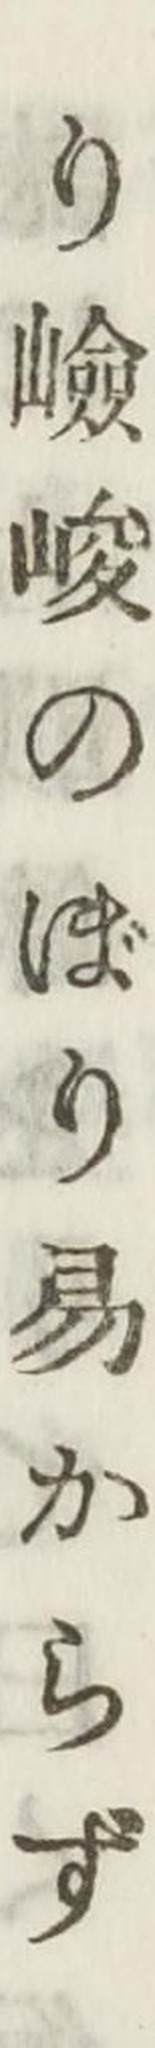り嶮峻のぼり易からず
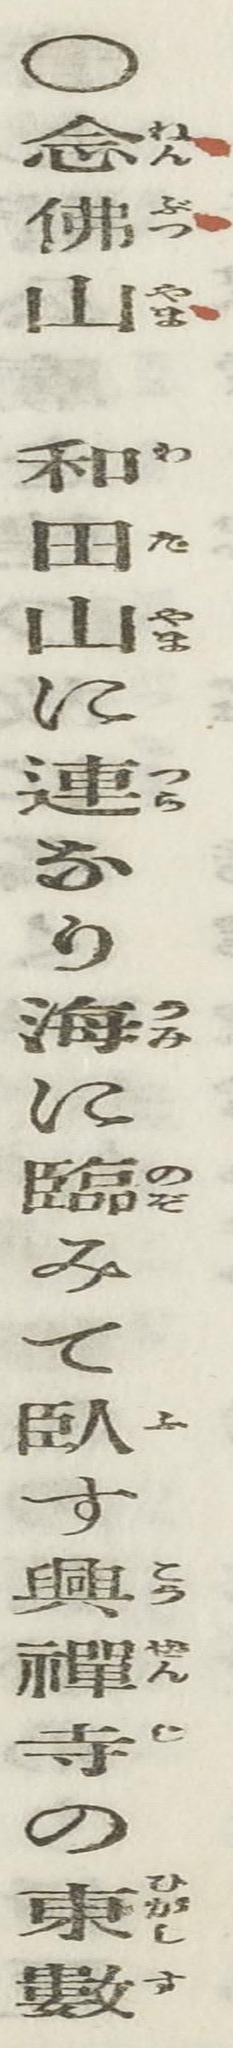○念佛山和田山に連なり海に臨みて臥す興禅寺の東数
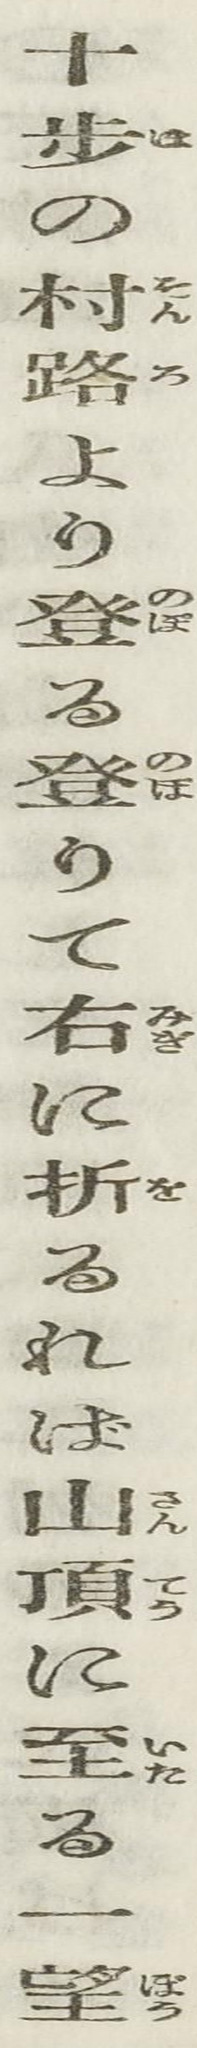十歩の村路より登る登りて右に折るれば山頂に至る一望
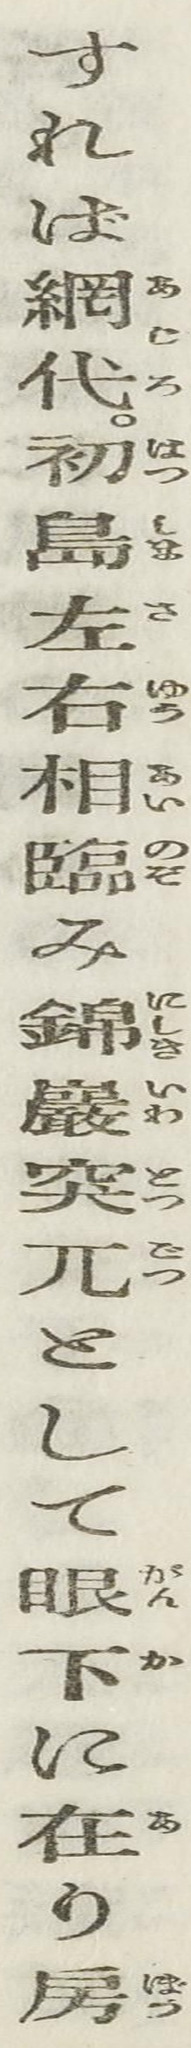すれば網代。初島左右相臨み錦巌突兀として眼下に在り房
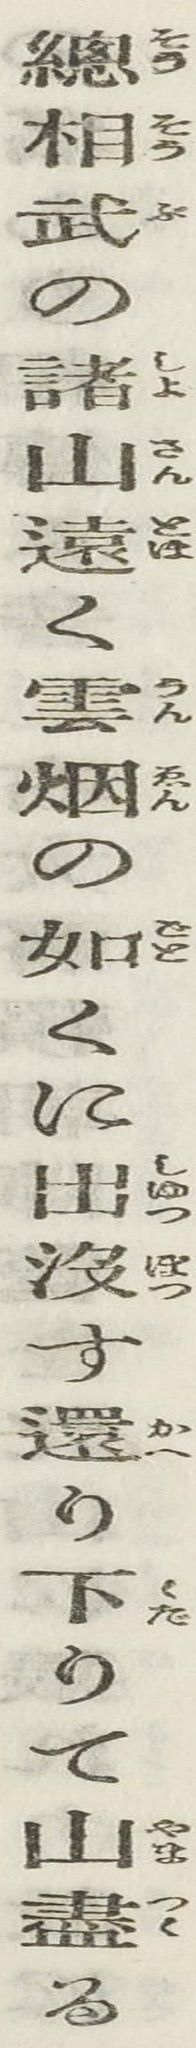総相武の諸山遠く雲烟の如くに出没す還り下りて山盡る
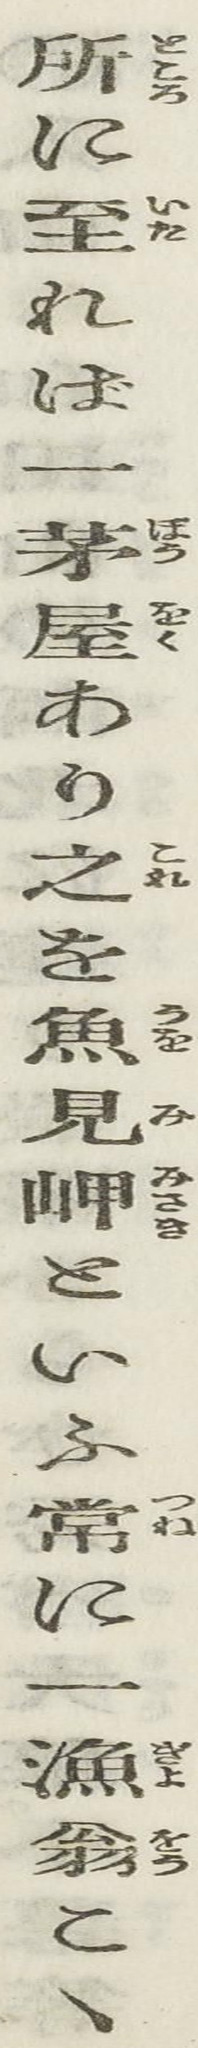所に至れば一茅屋あり之を魚見岬といふ常に一漁翁こヽ
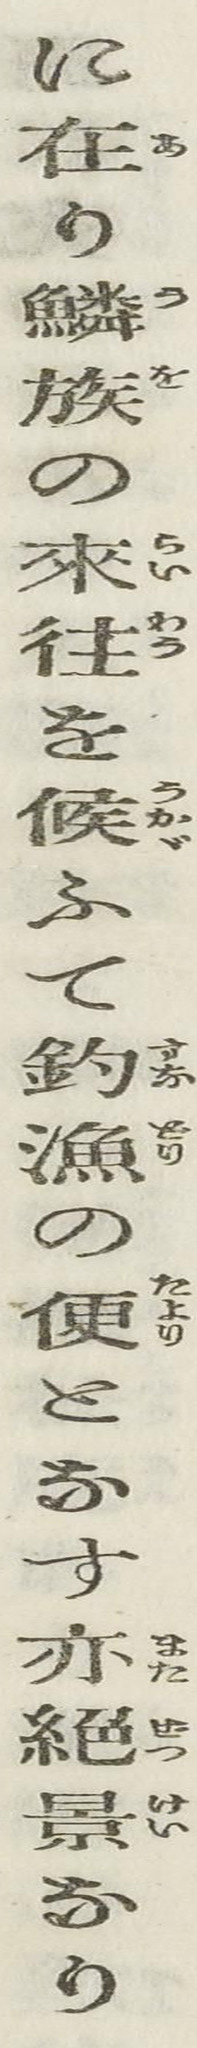に在り鱗族の来往を候ふて釣漁の便となす亦絶景なり
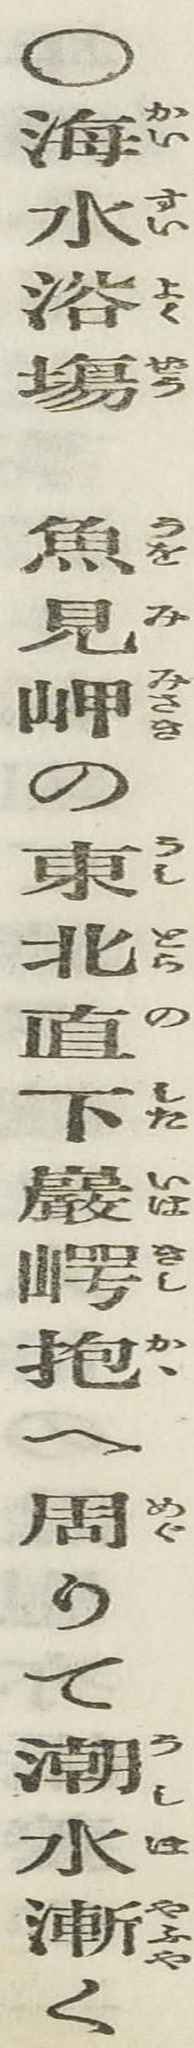○海水浴場魚見岬の東北直下巌崿へ周りて潮水漸く

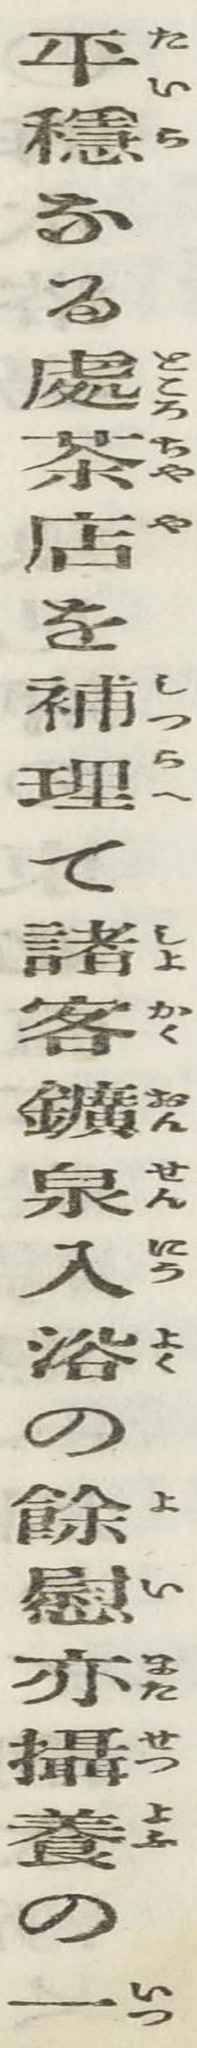平穏なる處茶店を補理て諸客鑛泉入浴の餘慰亦摂養の一
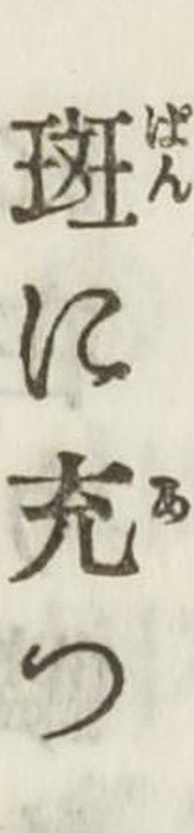斑に充つ
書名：熱海獨案内　全
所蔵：東京大学地震研究所図書室 Earthquake Research Institute Library, The University of Tokyo, JAPAN
